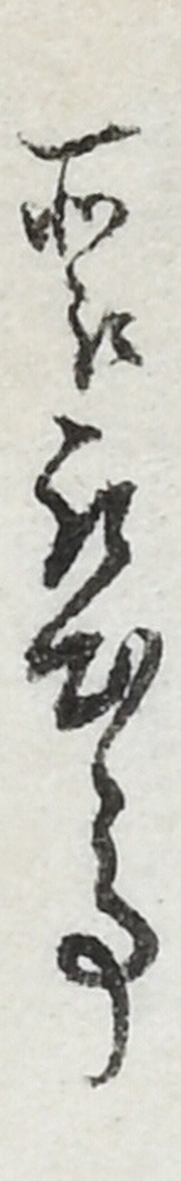所江罷出候事
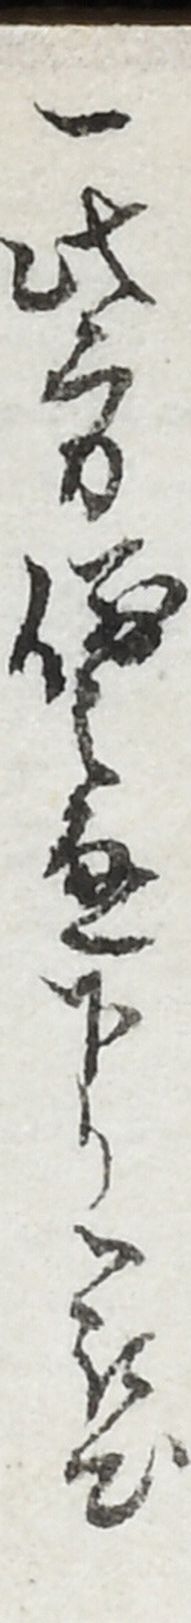一此方例之通下りへ被出
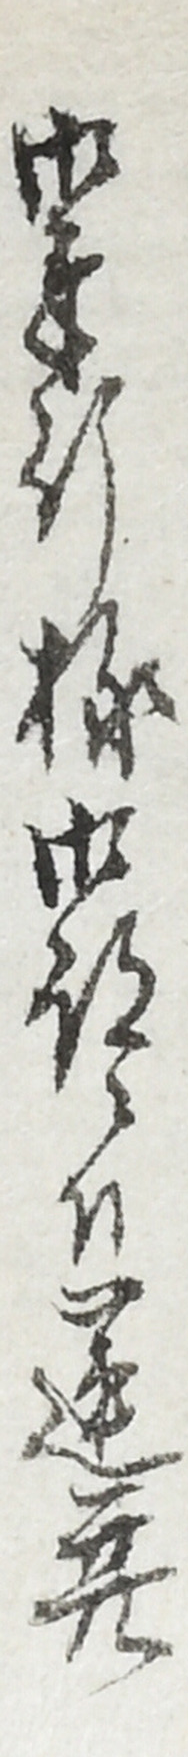御奉行様御跡ニ付運弁
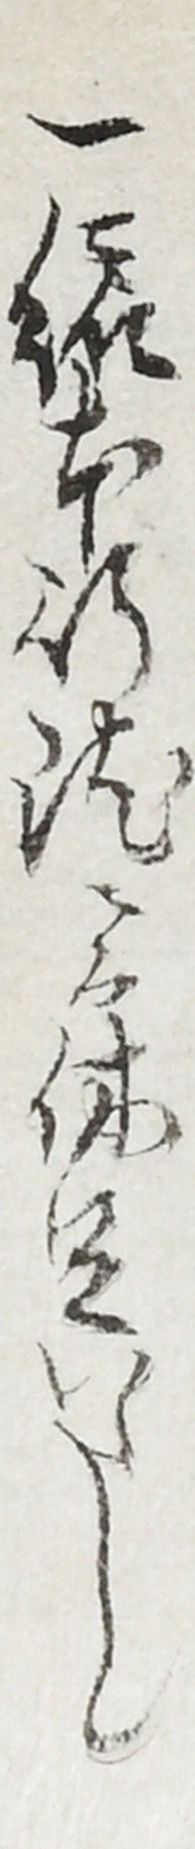一統本行院ニ而休足いたし候
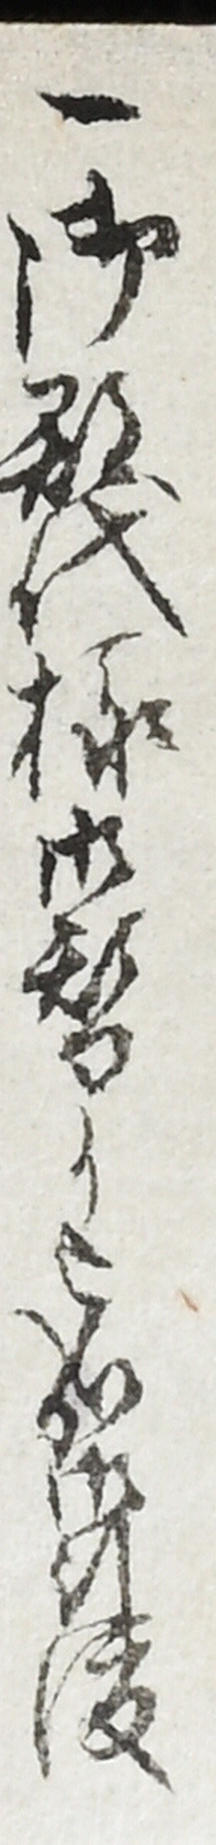一御郡代様御替り被成御引渡
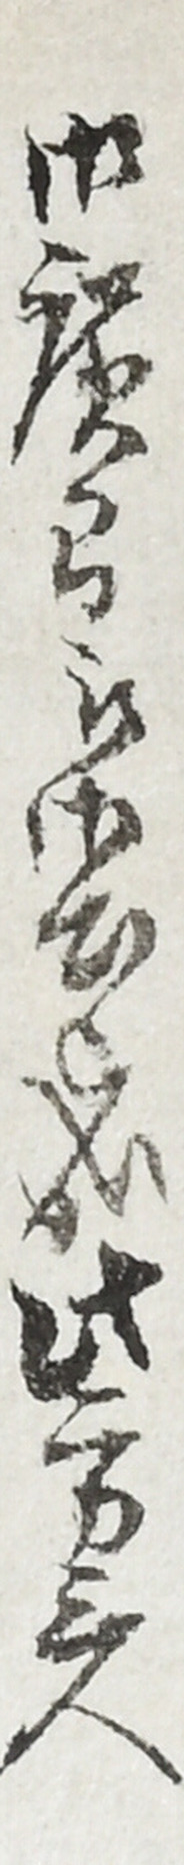御広間江御出被成此方三人
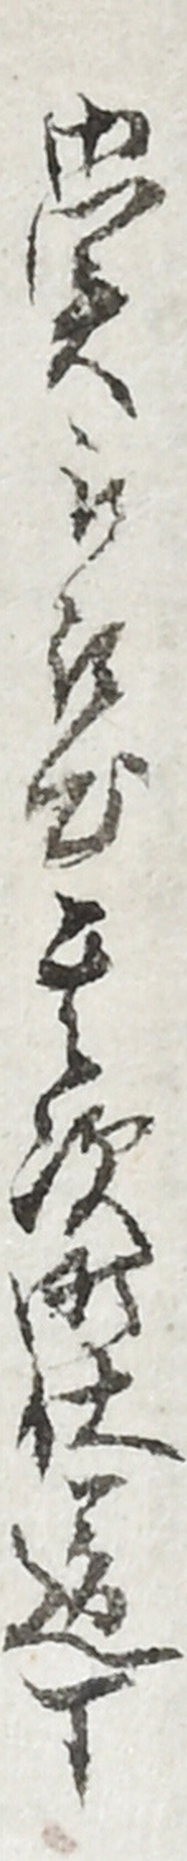御実被仰出其次町仕道丁
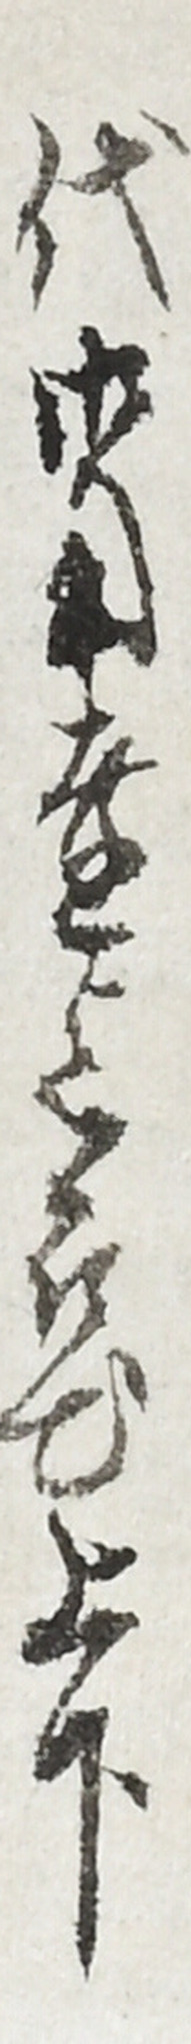代御用達迄召出上下
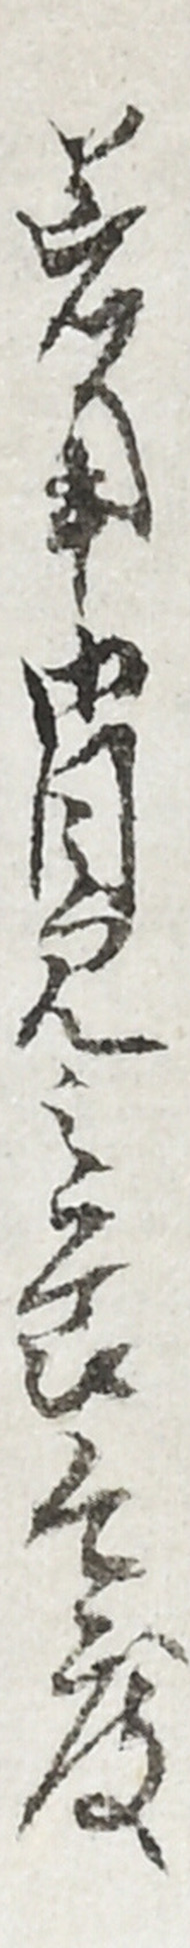着用御目見之節今度
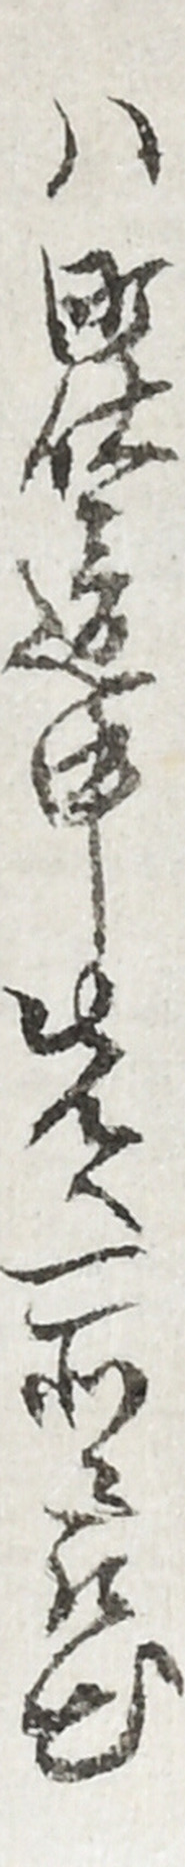ハ町仕道中先へ一所ニ罷出
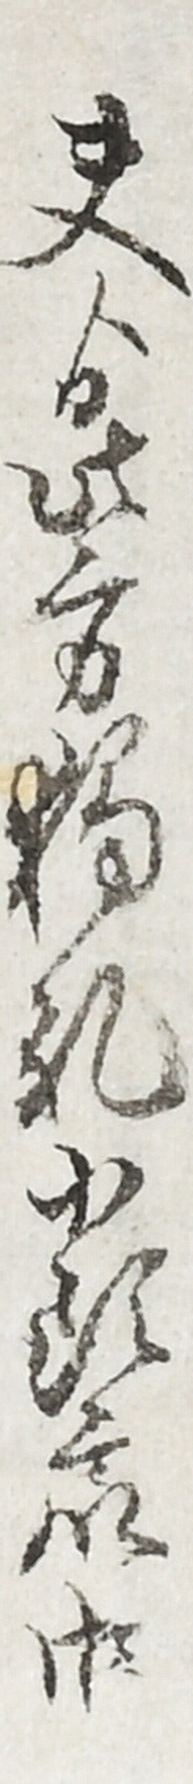夫より此方独礼小頭衆御
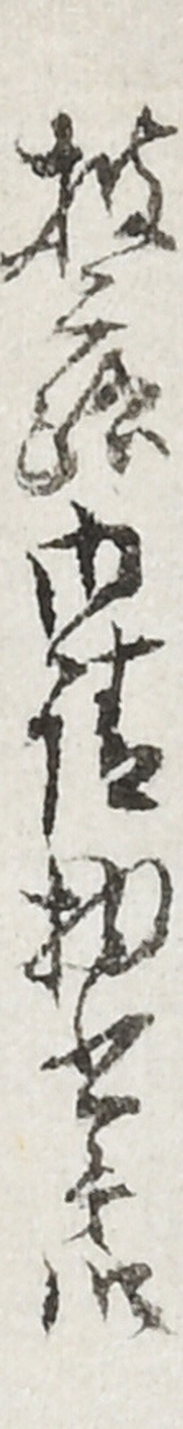披露御請物書衆
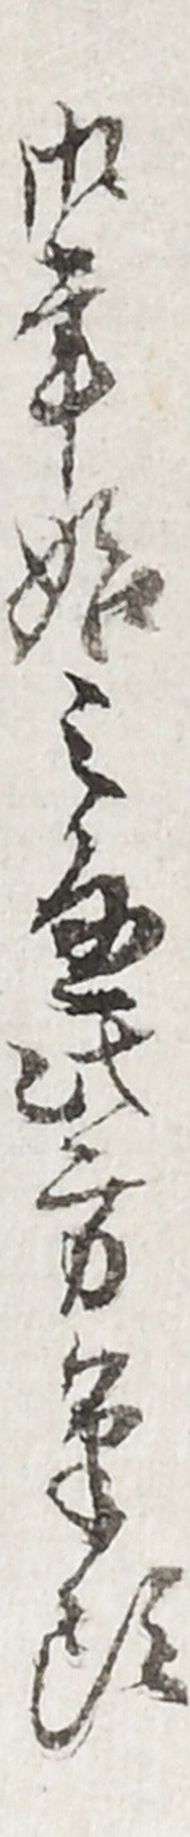御年始之通此方筆頭
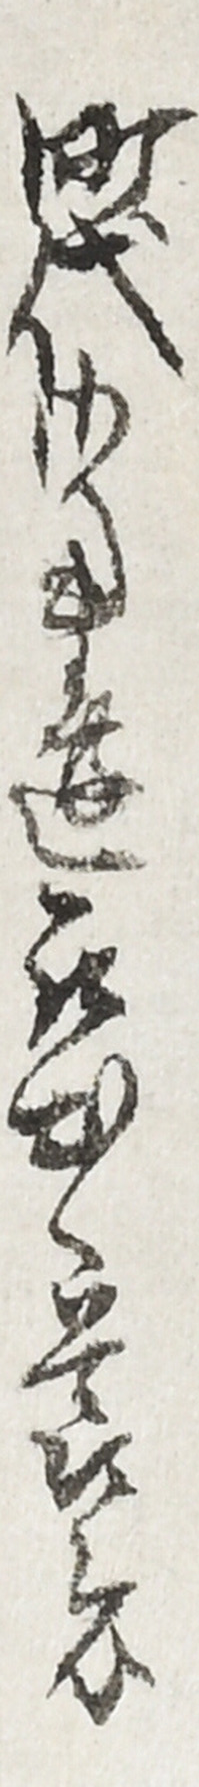町代御用達罷出候節は
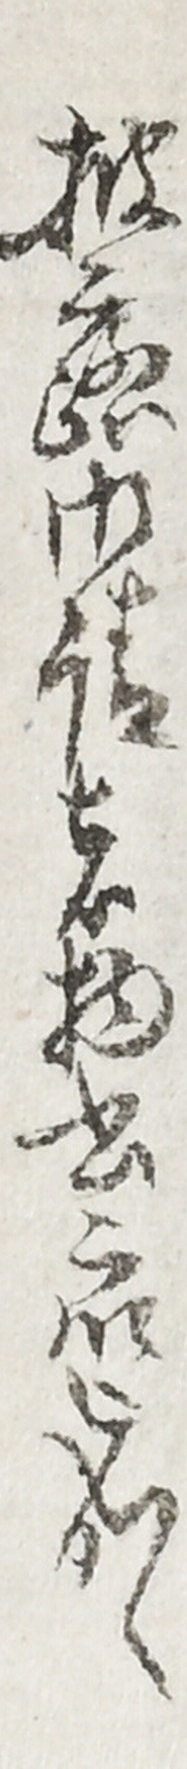披露御請者物書衆被成候
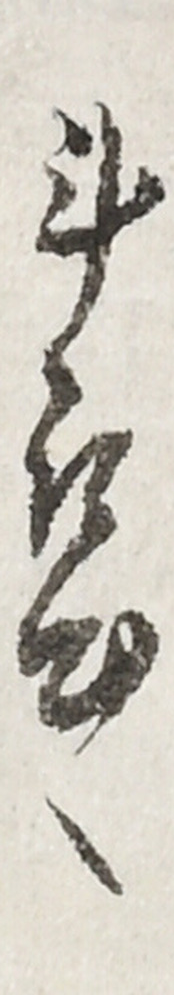斗被出候
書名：年内行事懐中録
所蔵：伊那市立高遠町図書館・合同会社AMANE
